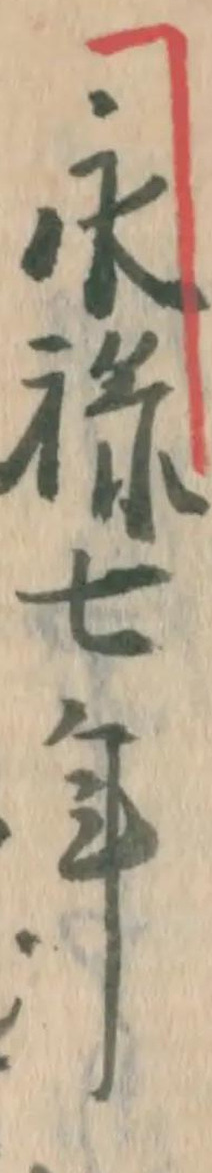永禄七年
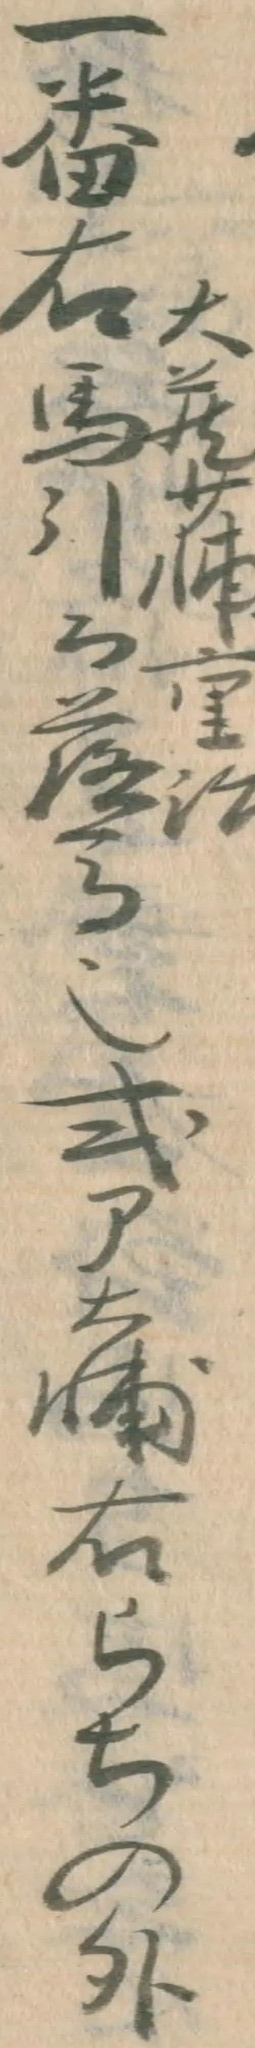一番右馬引而落馬也式部大輔右らちの外
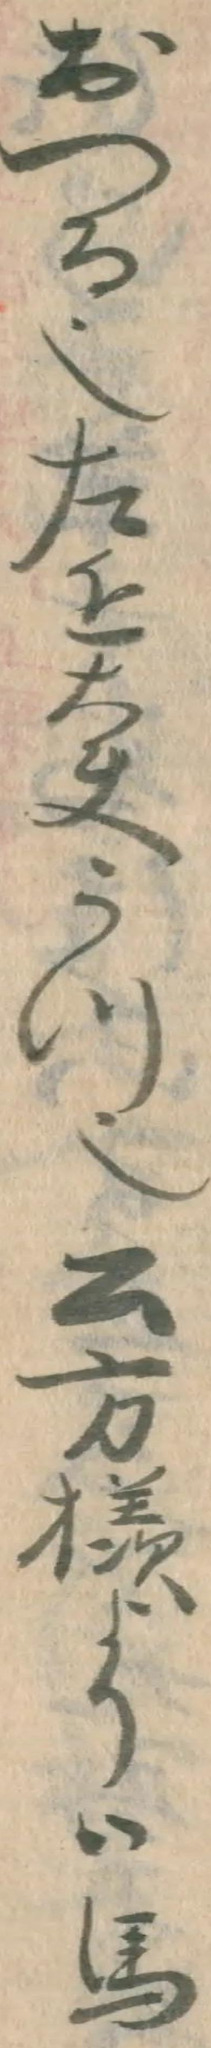出つる也左近大夫うつ也公方様より御馬
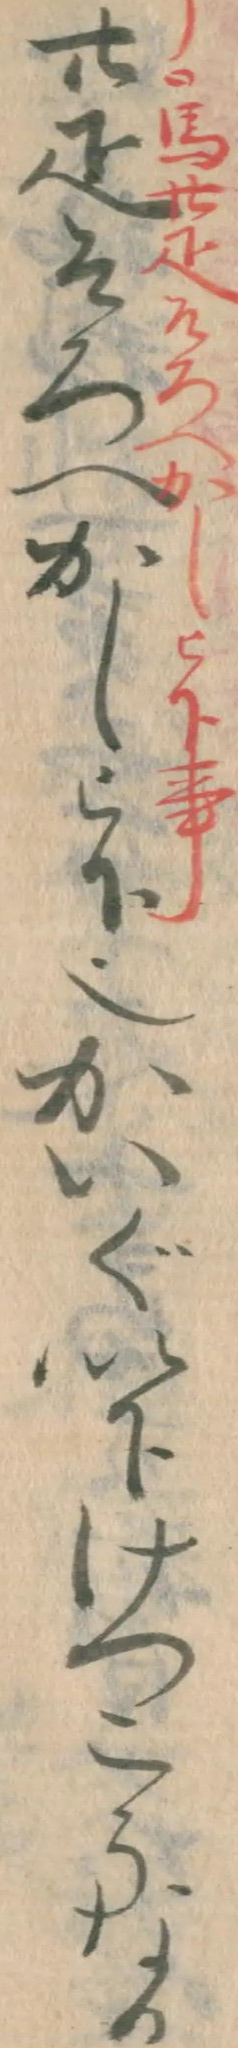廿疋そろへかし被下也かいぐ以下けつこうなる
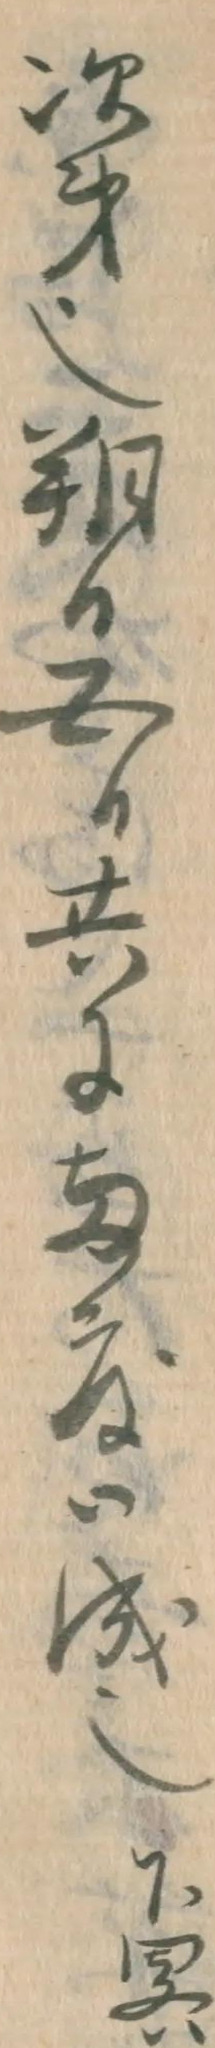次第也朔日五日共に両度御成也下略
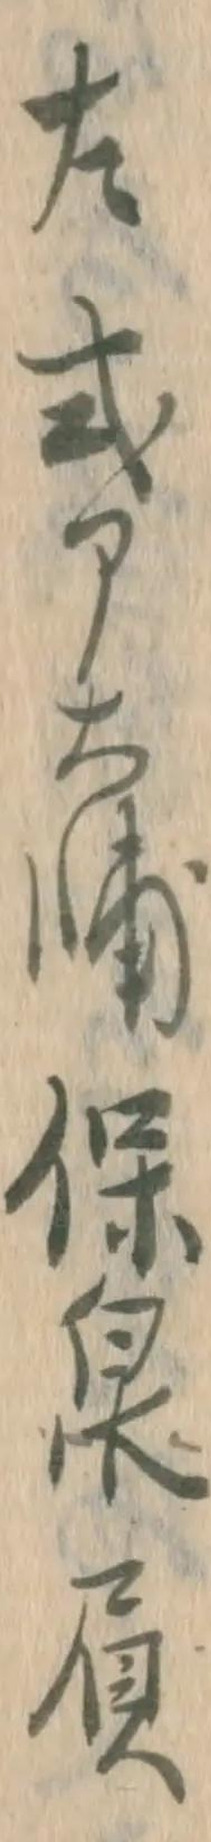左式部大輔保泉負
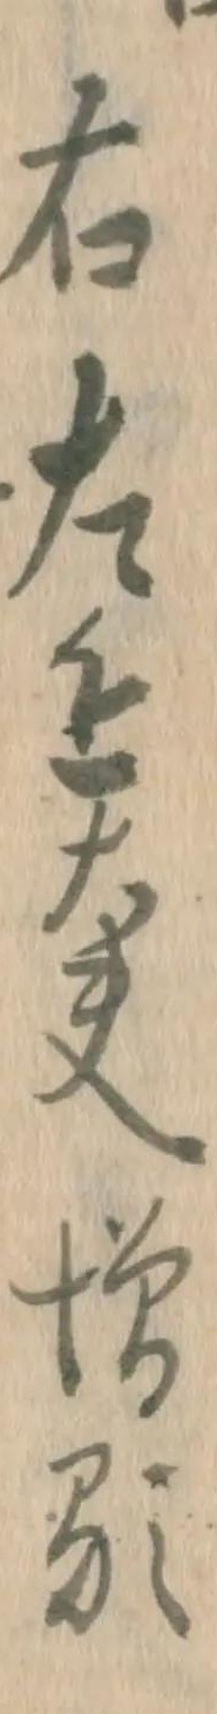右左近大夫増顕
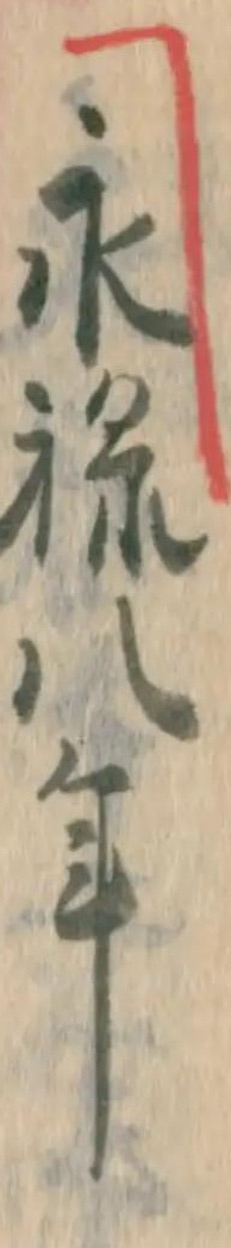永禄八年
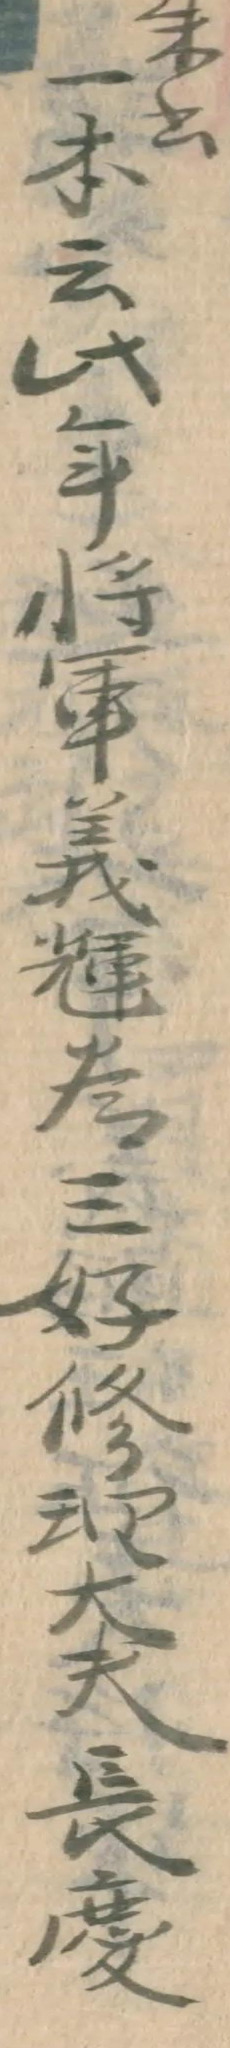一本云此年将軍義輝為三好修理大夫長慶
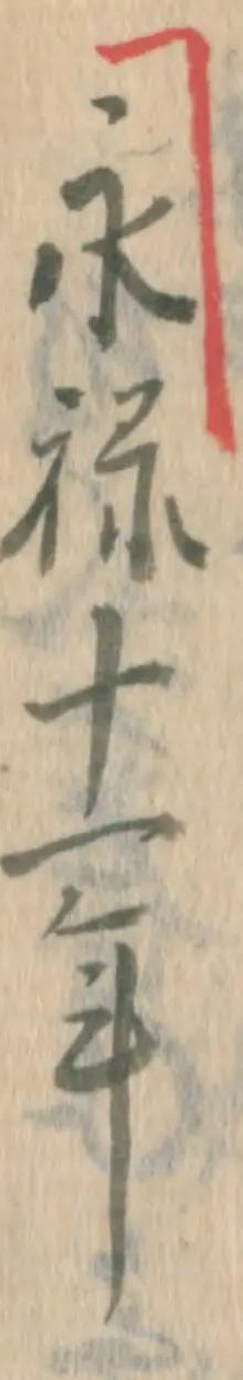永禄十一年
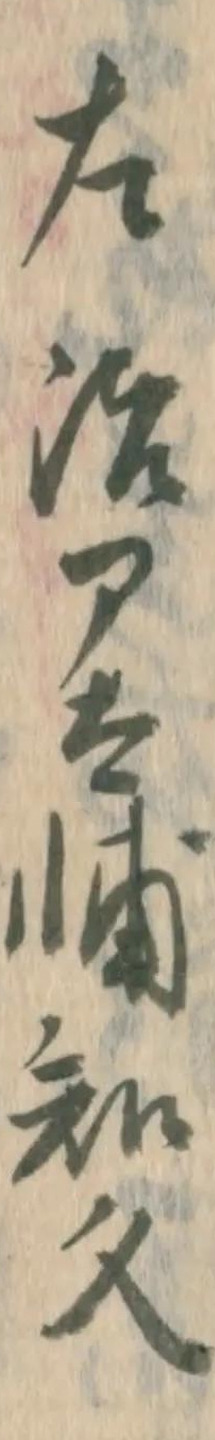左治部太輔知久
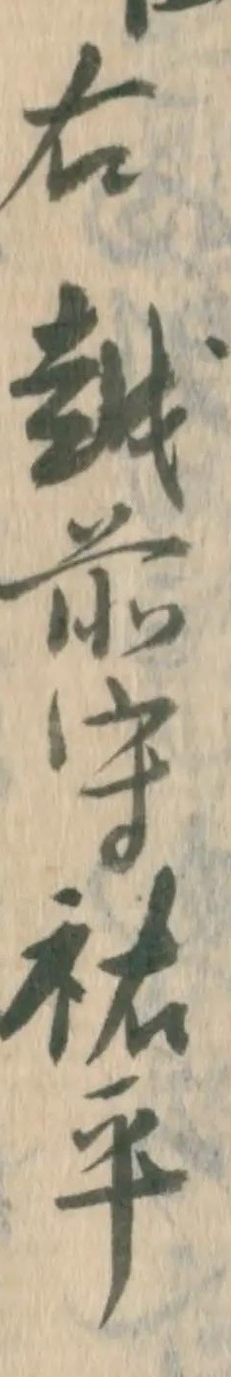右越前守祐平
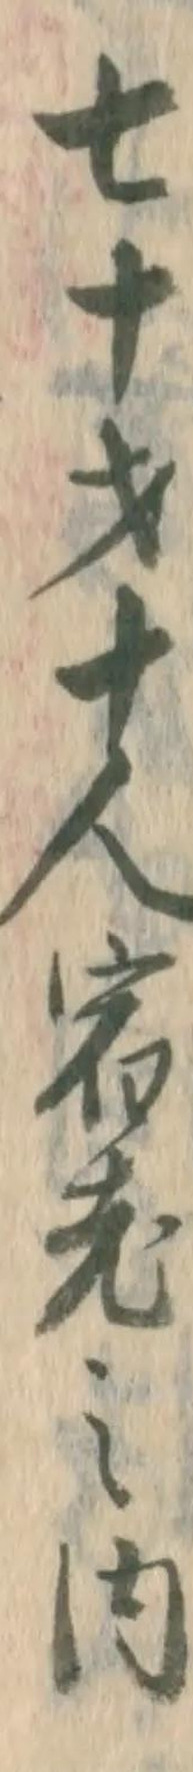七十才十人宿老之内
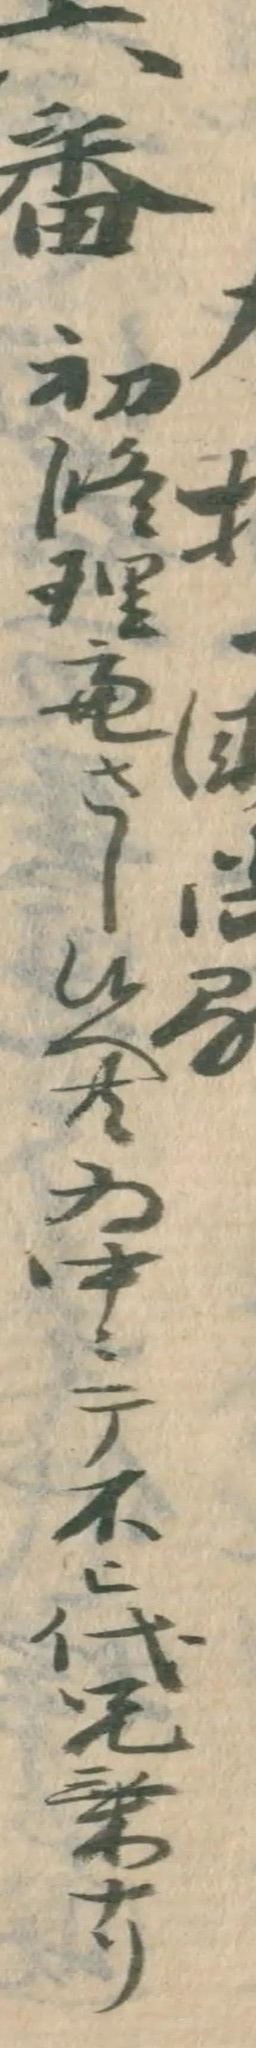六番初修理痛さし候へ共為中ニテ不被代兄乗ナリ
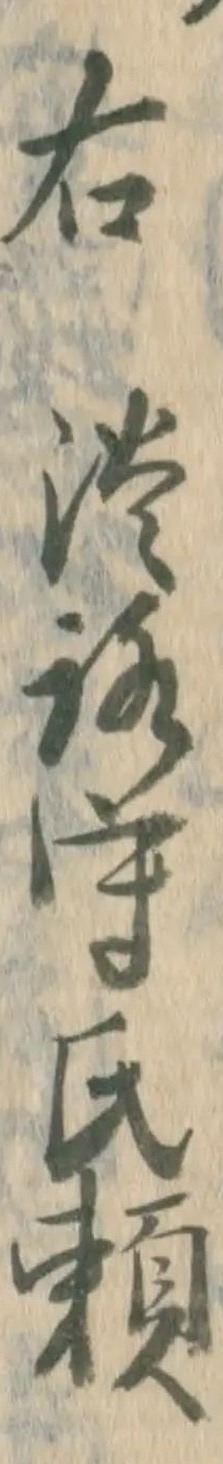右淡路守氏頼

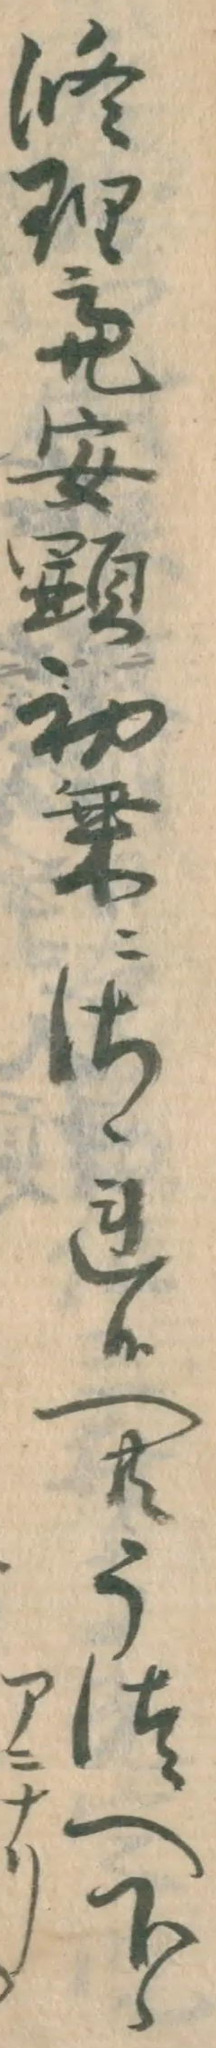修理亮安顕初乗にさゝれ候へ共うつへ下候
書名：賀茂社記録. 第10冊
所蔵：国立国会図書館 National Diet Library, JAPAN
